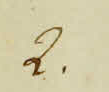2.
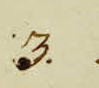3.
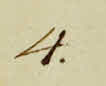4.
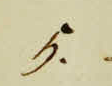5.
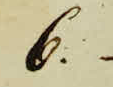6.
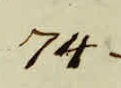74
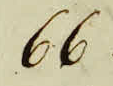66
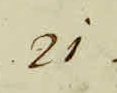21
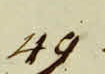49
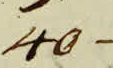40
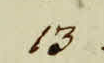13
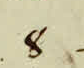8
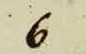6
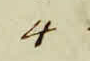4
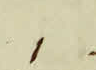1
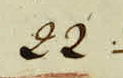22
